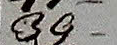39
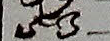53
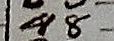48
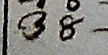38
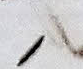1
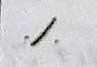1.
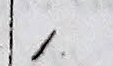1.
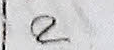2
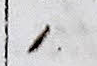1.
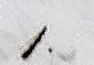1.
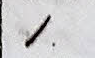1.
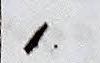1.
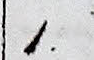1.
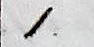1.
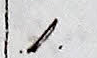1.
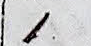1.
